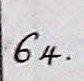64
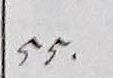55.
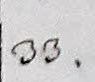33
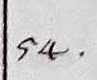54
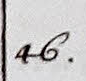46
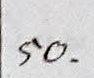50
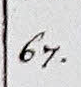67
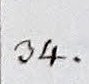34
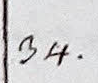34
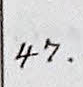47
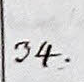34
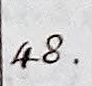48
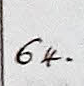64
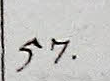57.
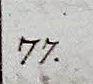77.
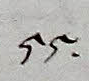55
